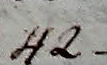42
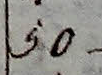50
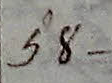58
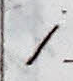1
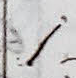1
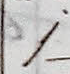1
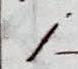1
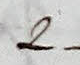2
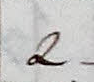2
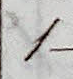1
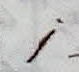1
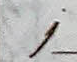1
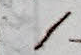1
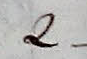2
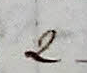2
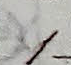1
